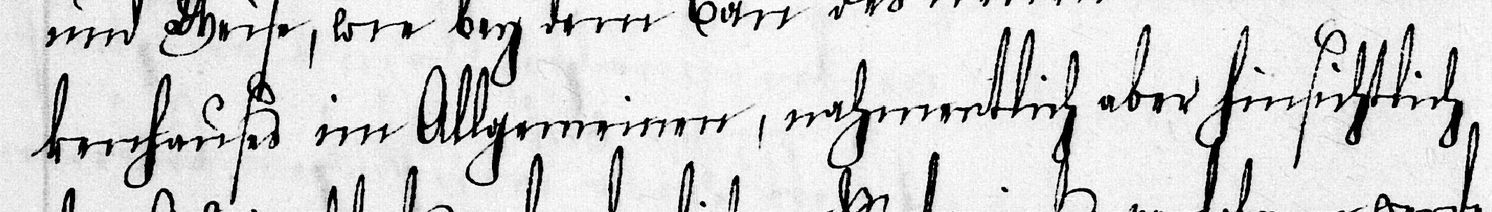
kenhauses im Allgemeinen, nahmentlich aber hinsichtlich
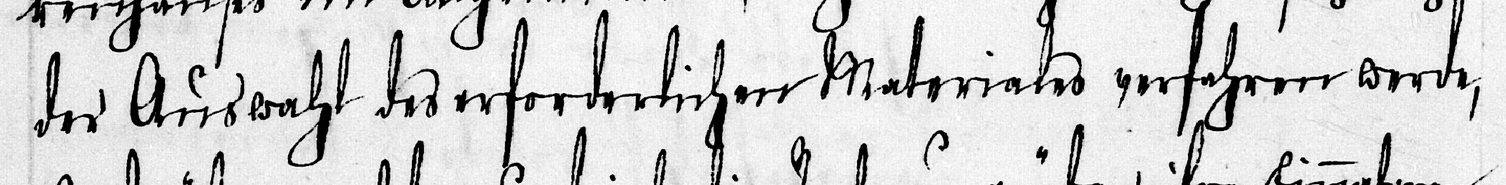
der Auswahl des erforderlichen Materiales verfahren werde,
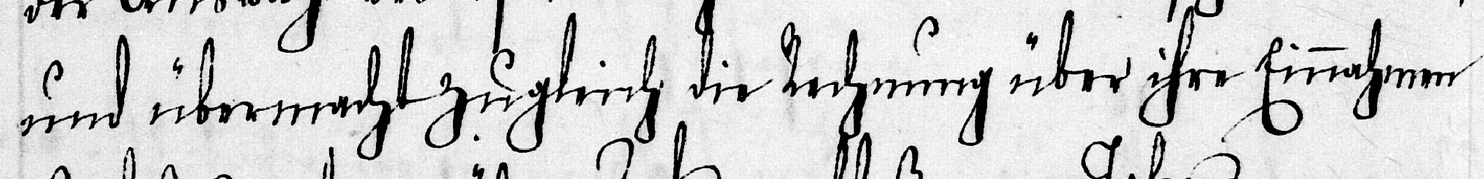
und übermacht zugleich die Rechnung über ihre Einnahmen
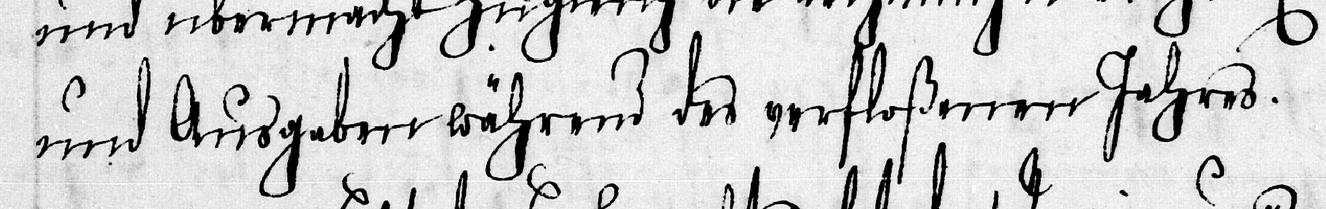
und Ausgaben während des verfloßenen Jahres.
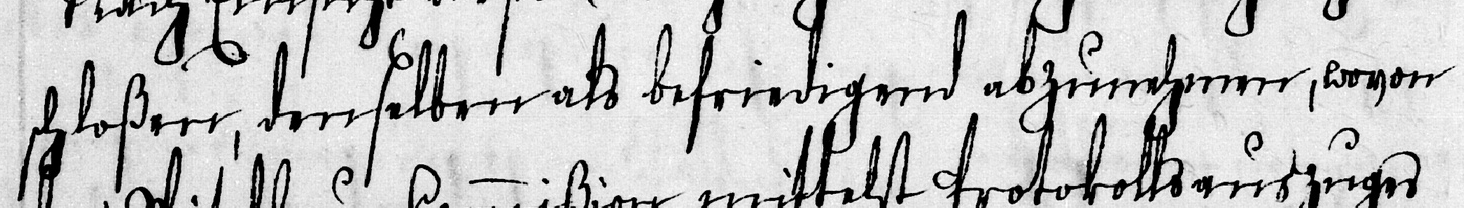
schloßen, denselben als befriedigend abzunehmen, wovon
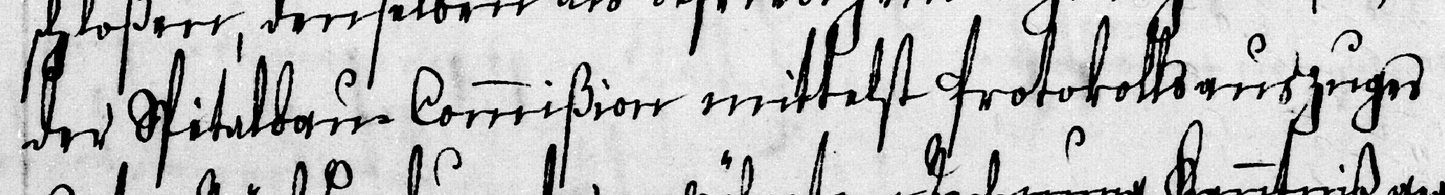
der Spitalbau-Commißion mittelst Protokollsauszuges
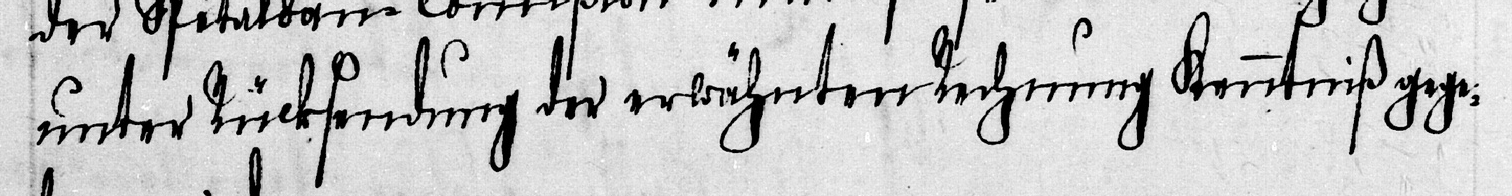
unter Rücksendung der erwähnten Rechnung Kenntniß gege¬
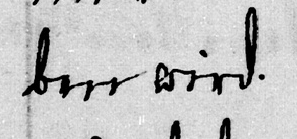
ben wird.
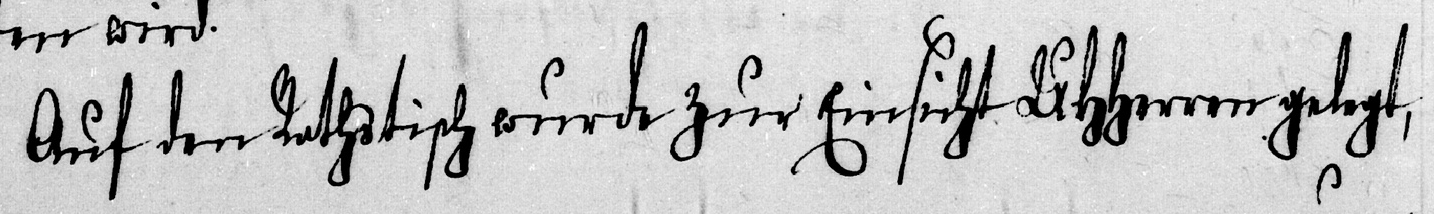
Auf den Rathstisch wurde zur Einsicht UHHerren geleg¬
